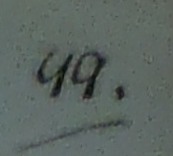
99.
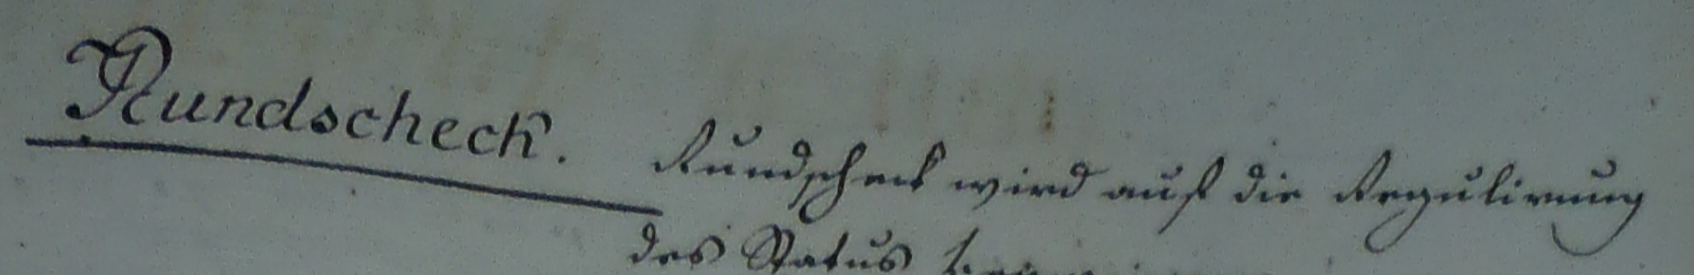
Rundscheck. Rundscheck wird auf die Regulirung
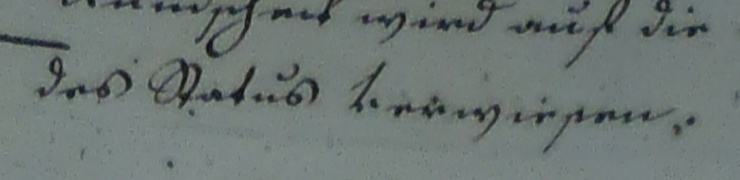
des Status verwiesen.
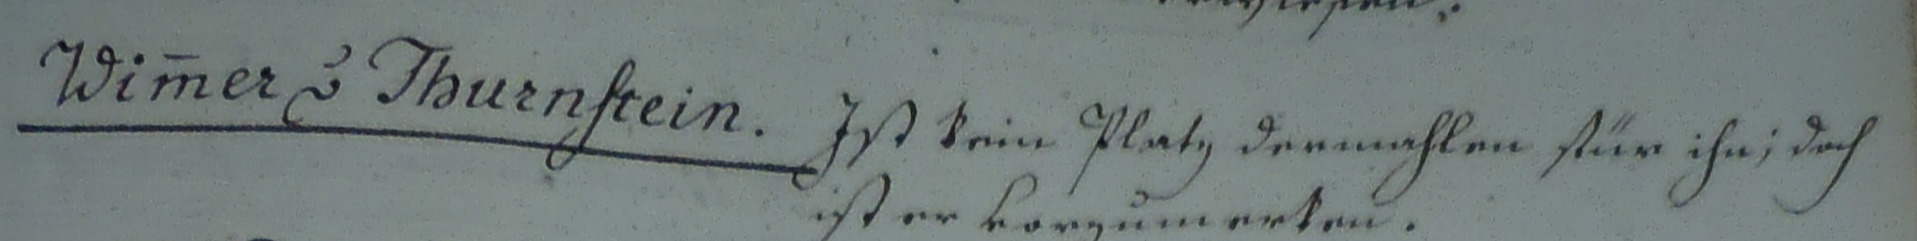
Wim̅er v Thurnstein. Ist kein Platz dermahlen für ihn; doch
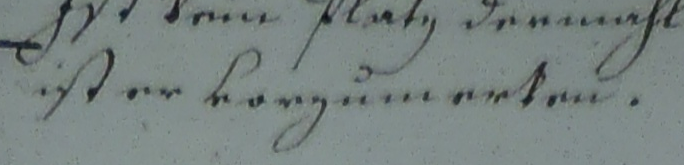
ist er vorzumerken.
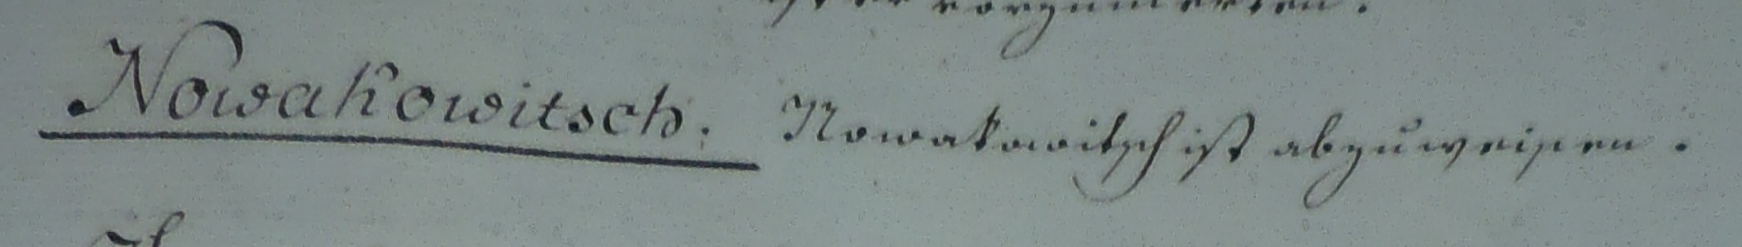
Nowakowitsch. Nowakowitsch ist abzuweisen.
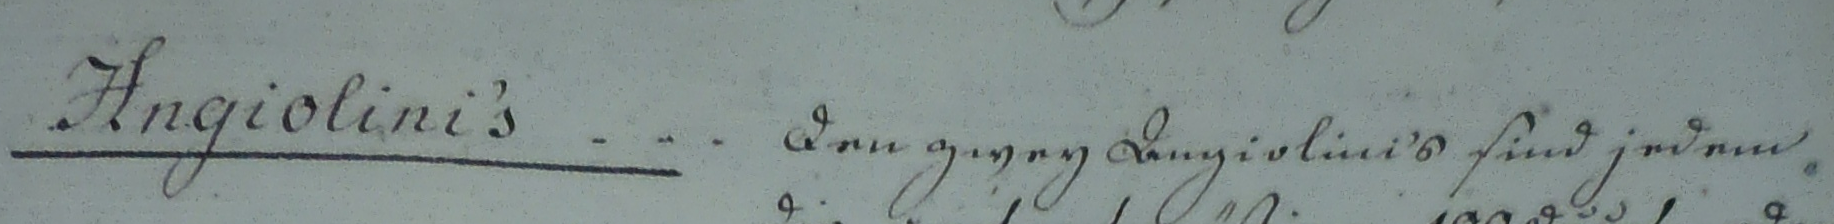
Angiolini's .. .. .. Den zwey Angiolini's sind jedem,
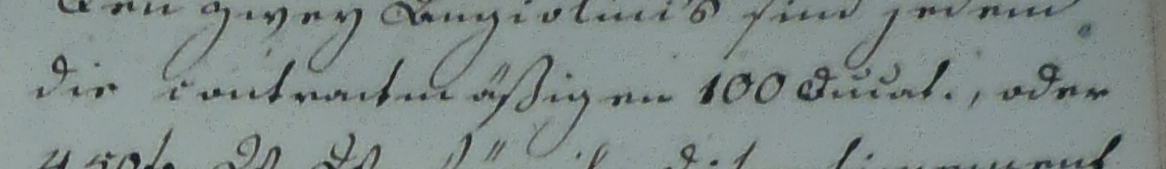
die contractmäßigen 100 Ducat., oder
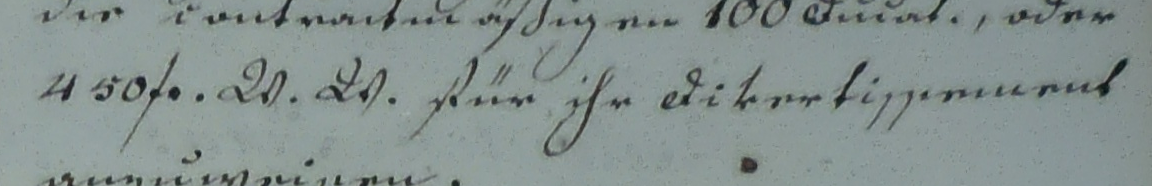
450fr. W. W. für ihr Divertissement
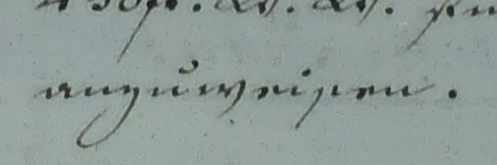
anzuweisen.
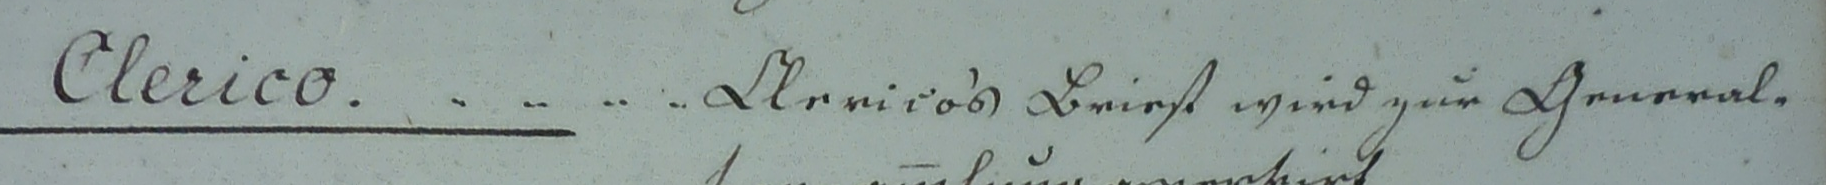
Clerico. .. .. .. .. Clerico's Brief wird zur General¬
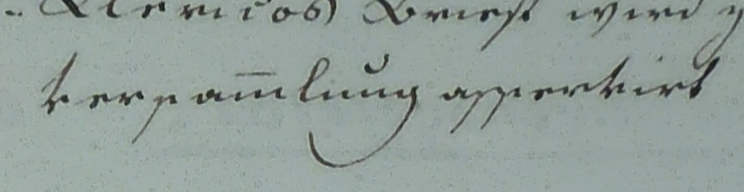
versam̅lung asservirt
